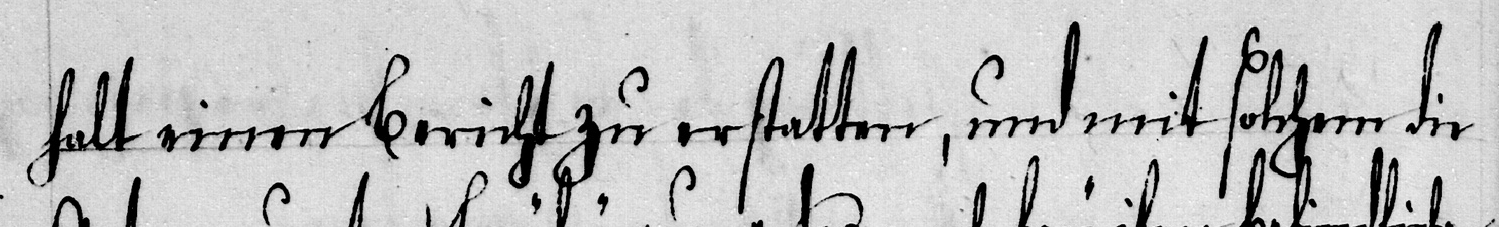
halt einen Bericht zu erstatten, und mit solchem die
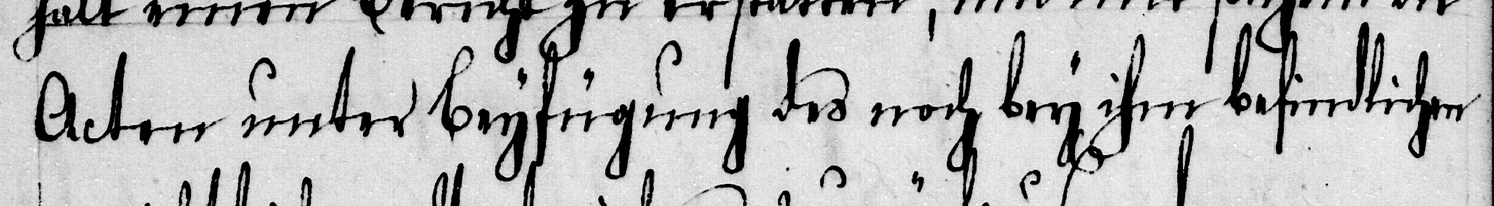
Acten unter Beyfügung des noch bey ihm befindlichen
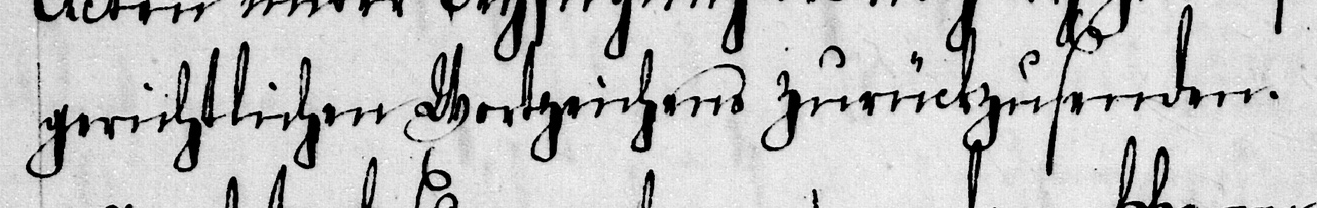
gerichtlichen Wortzeichens zurückzusenden.
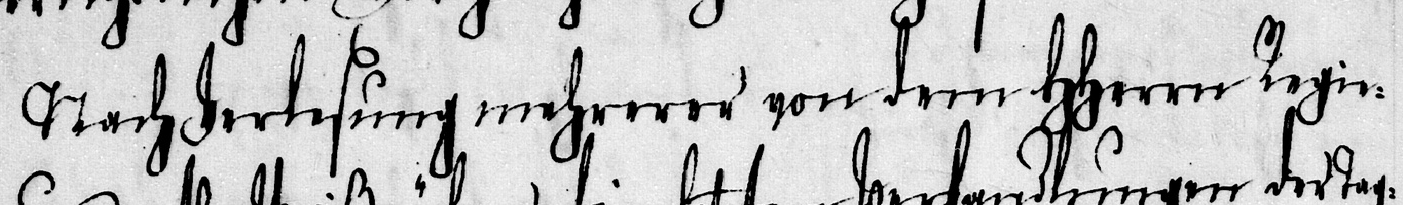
Nach Verlesung mehrerer von dem HHerrn Regie¬
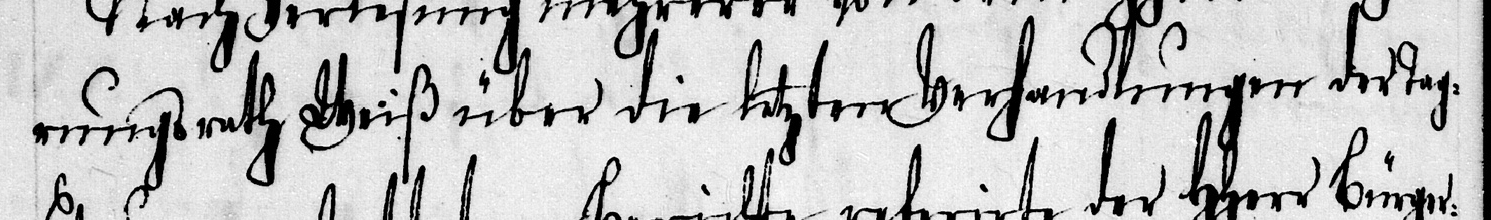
rungsrath Weiß über die letzten Verhandlungen der Tag¬
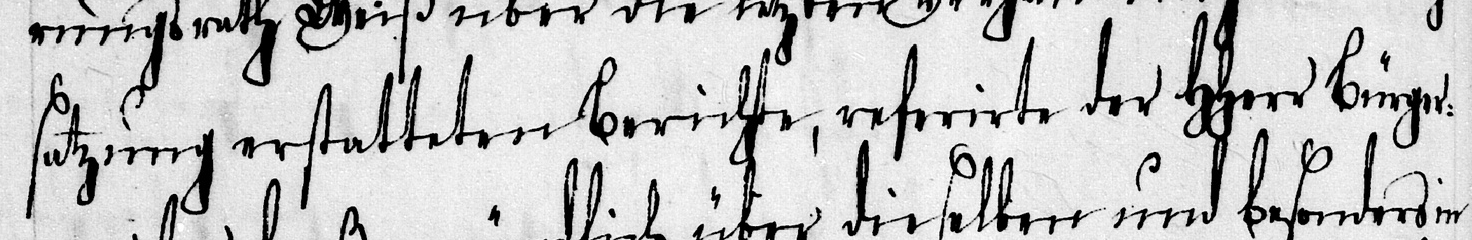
satzung erstatteten Berichte, referirte der HHerr Bürg¬
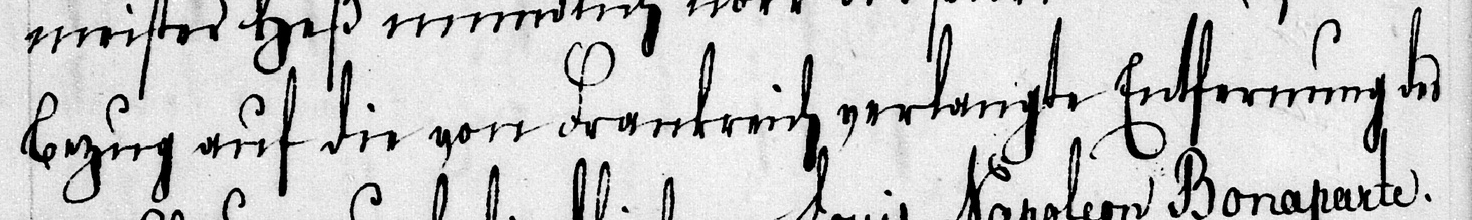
Bezug auf die von Frankreich verlangte Entfernung des
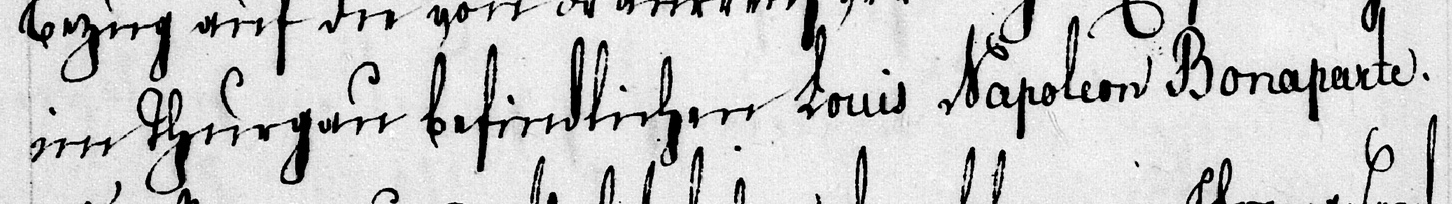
im Thurgau befindlichen Louis Napoleon Bonaparte.
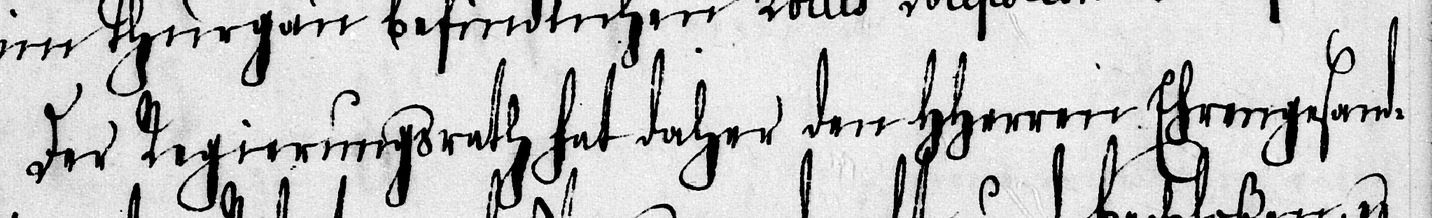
Der Regierungsrath hat daher den HHerren Ehrengesand¬
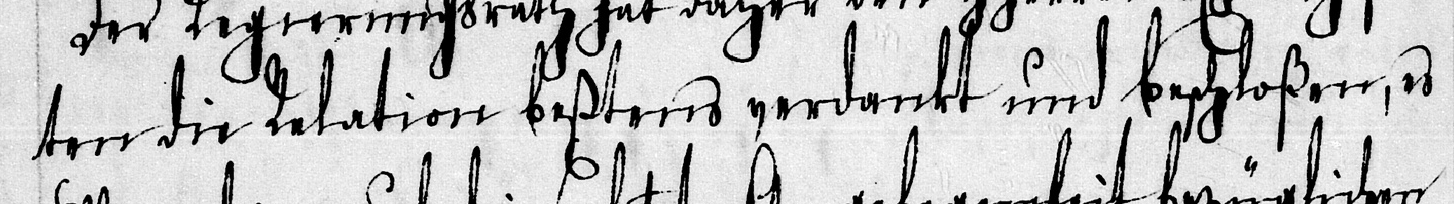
ten die Relation beßtens verdankt und beschloßen, es
